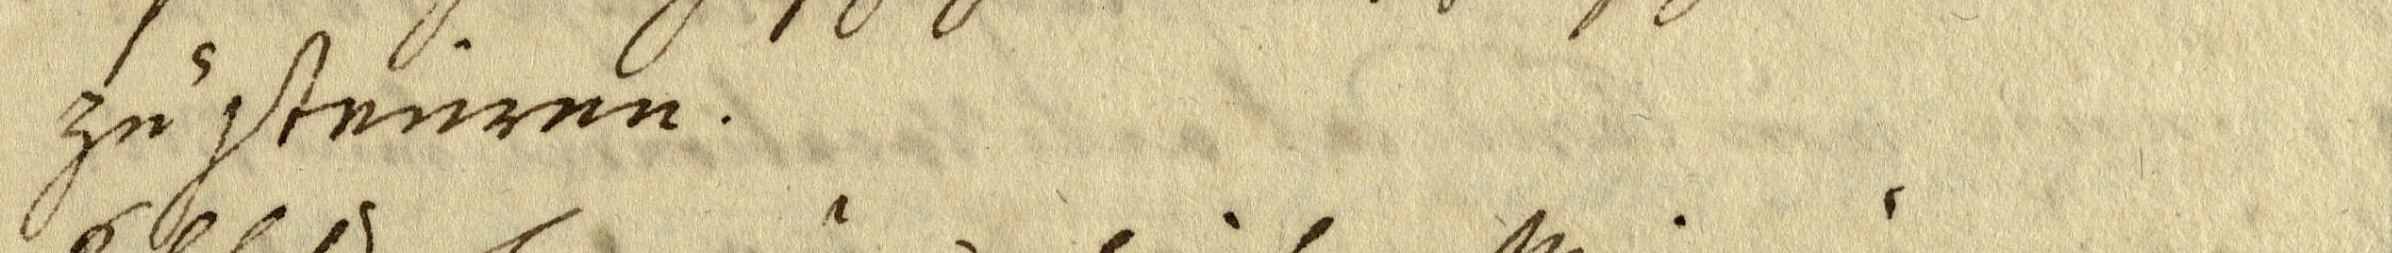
zu steuren.
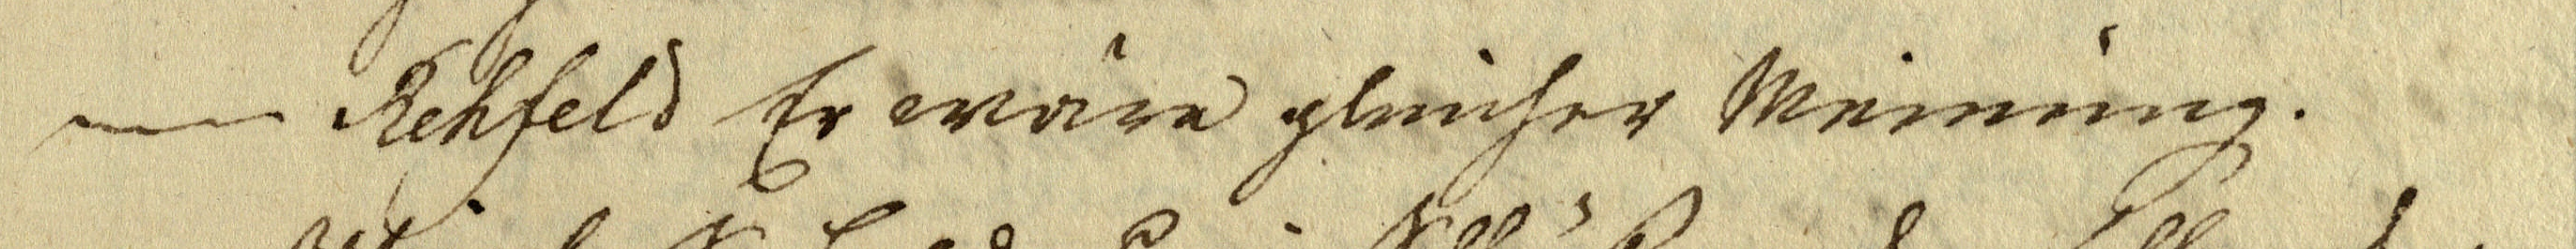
Rehfeld Er wäre gleicher Meinung.
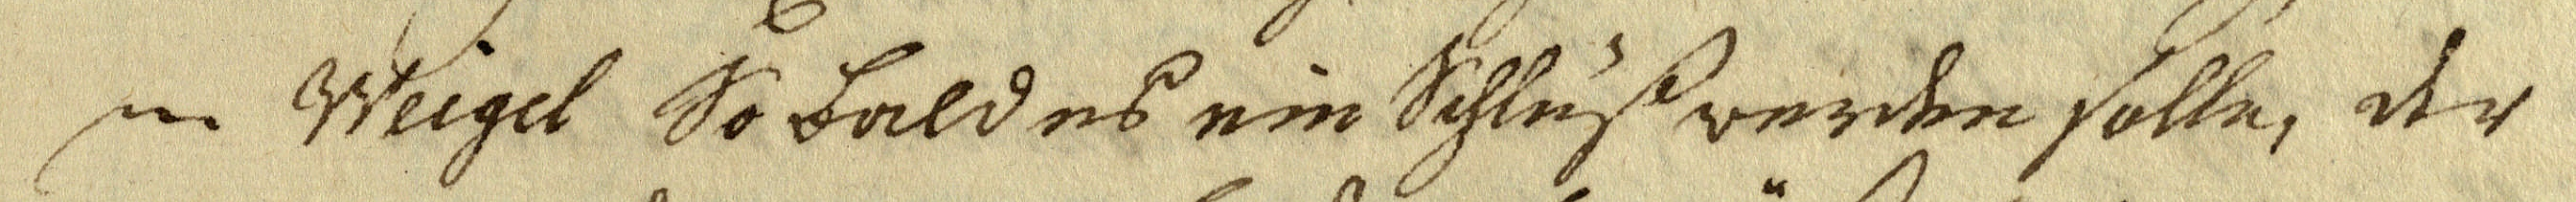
Weigel So bald es ein Schluß werden solle, der
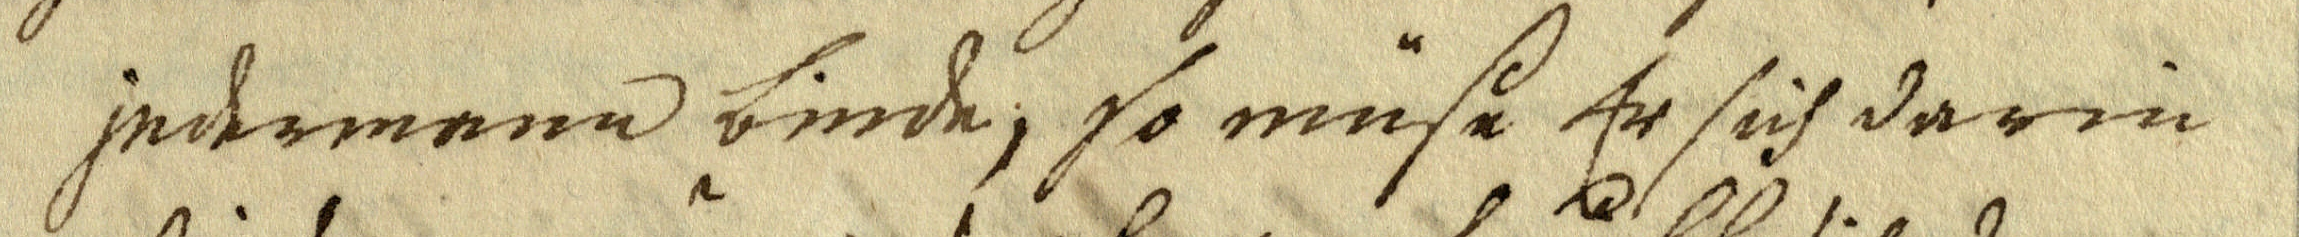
jedermann binde, so müße Er sich darin
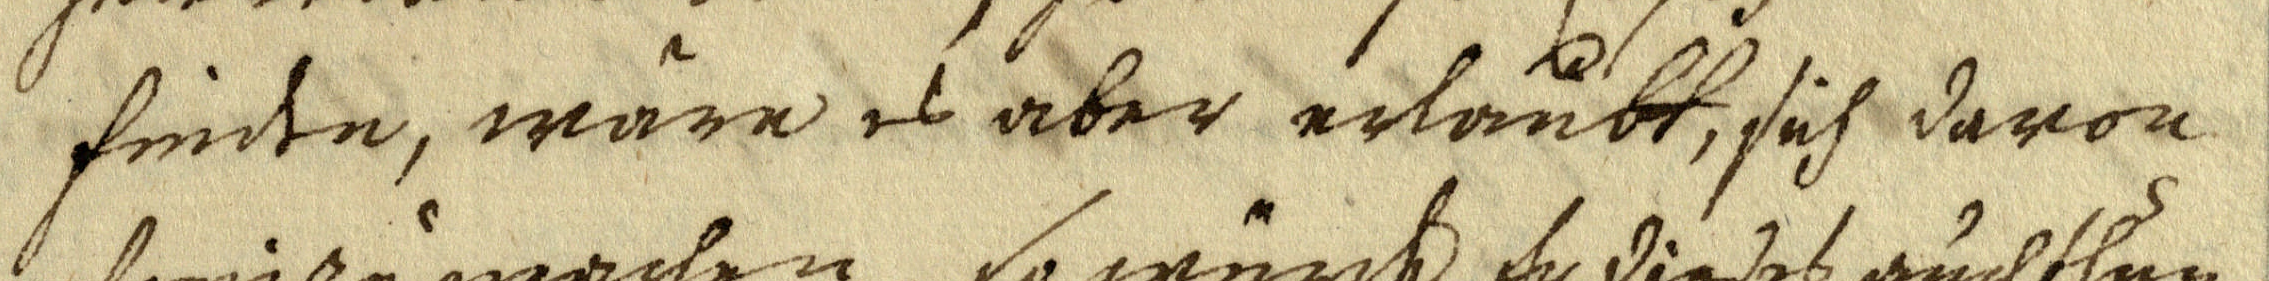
finden, wäre es aber erlaubt, sich davon
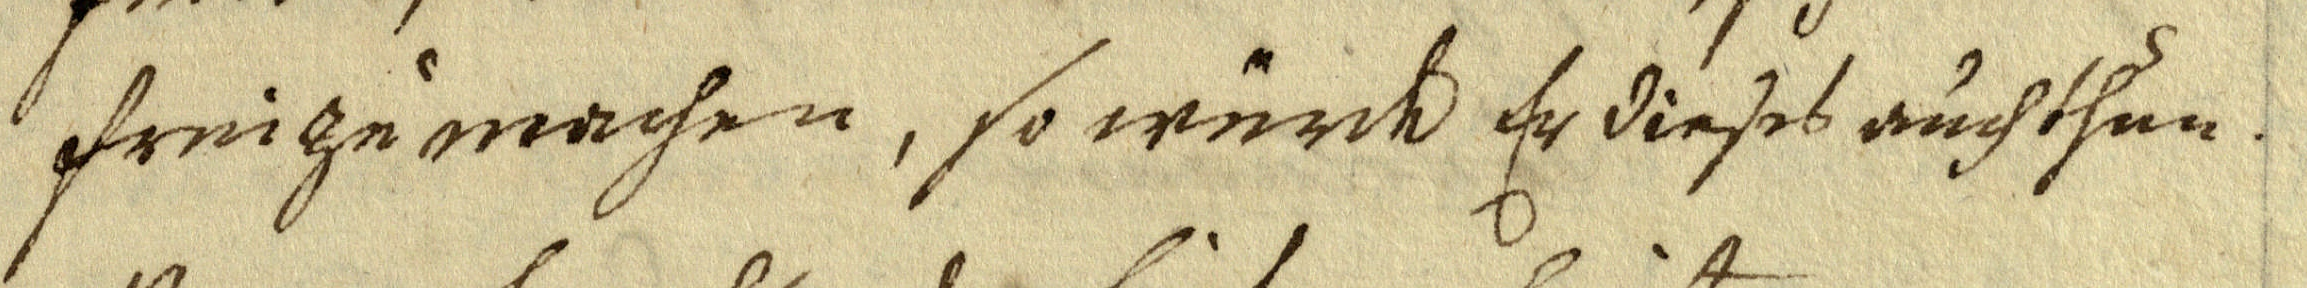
frei zumachen, so würde Er dieses auch thun.
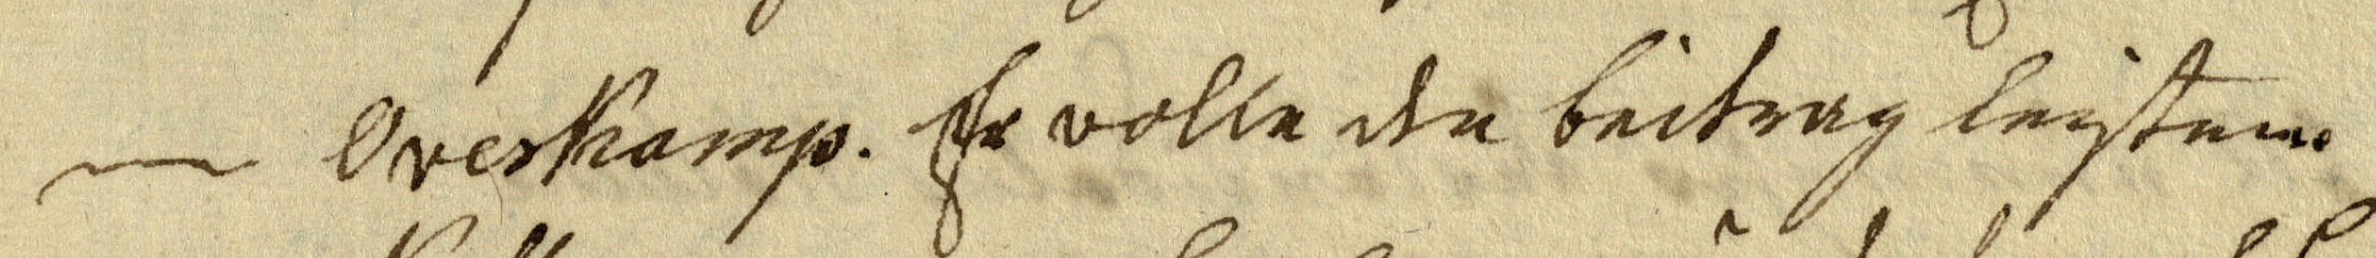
Overkamp. Er wolle den Beitrag leisten.
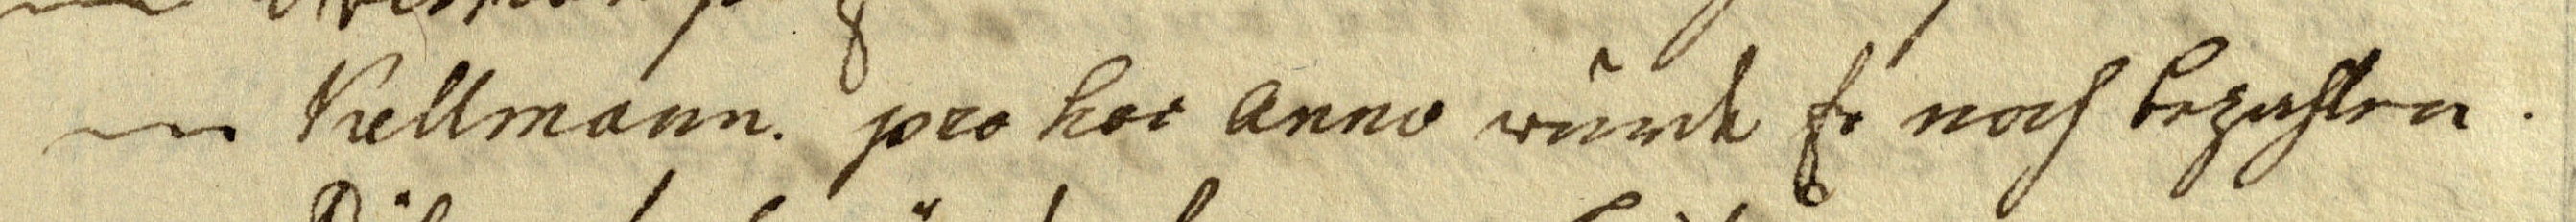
Kellmann. pro hoc anno würde Er noch bezahlen.
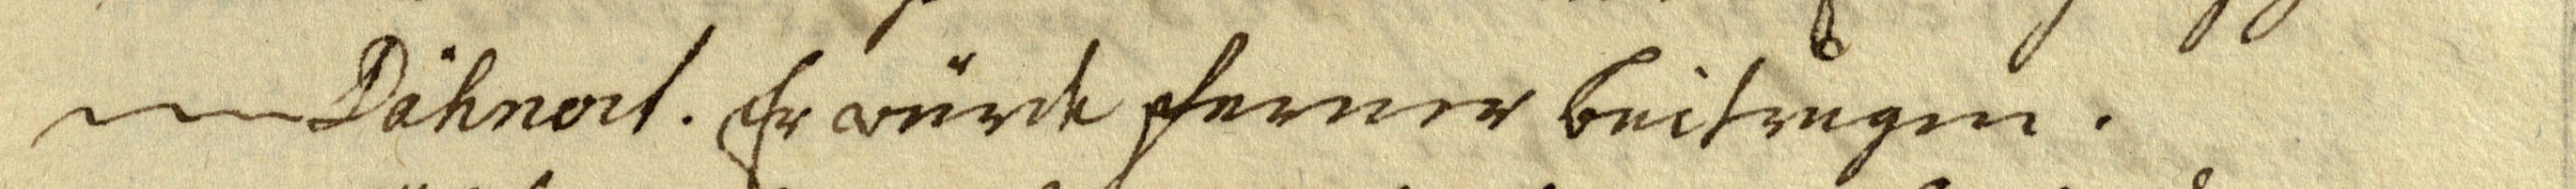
Dähnert. Er würde ferner beitragen.
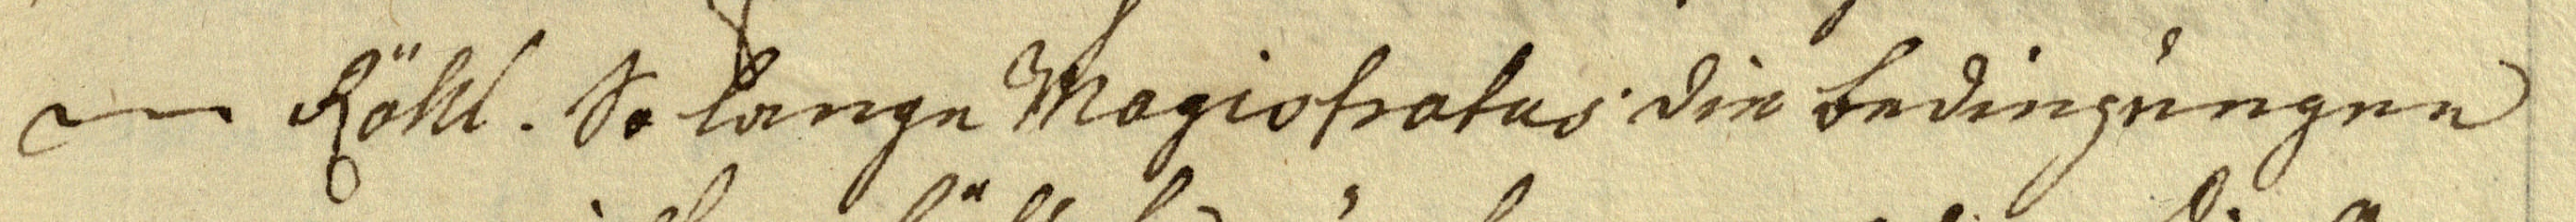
Röhl. So lange Magistratus die Bedingungen
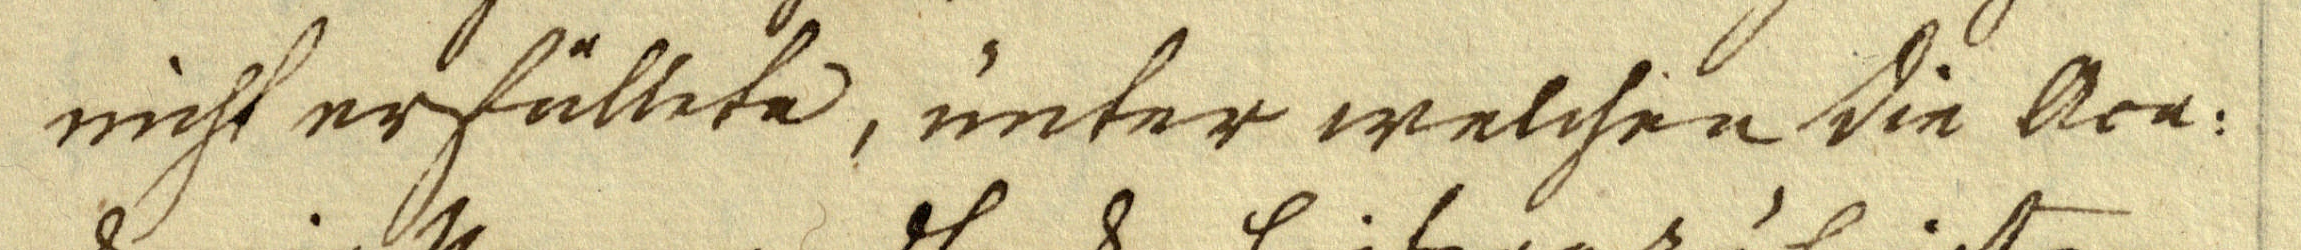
nicht erfüllete, unter welchen die Aca¬
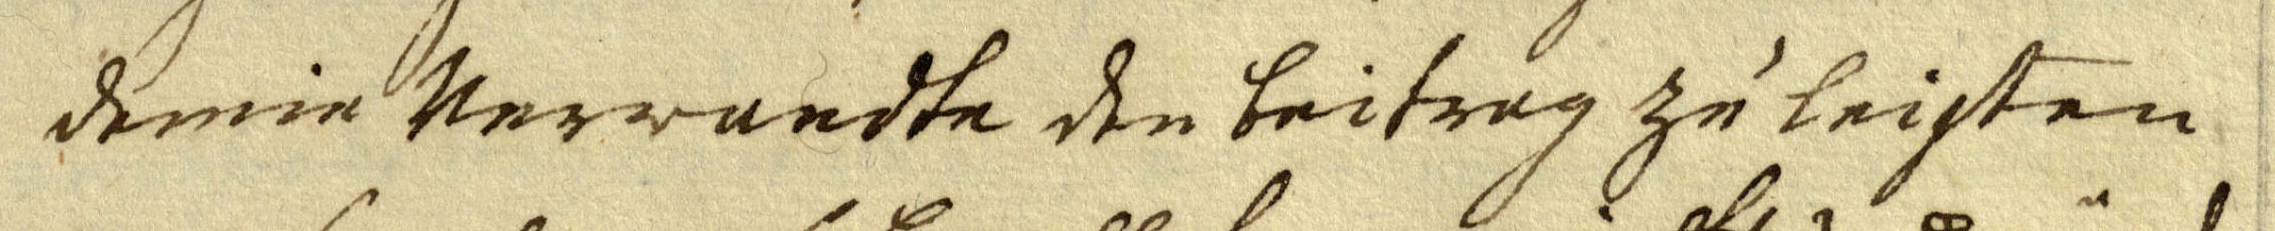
demie Verwandte den Beitrag zu leisten
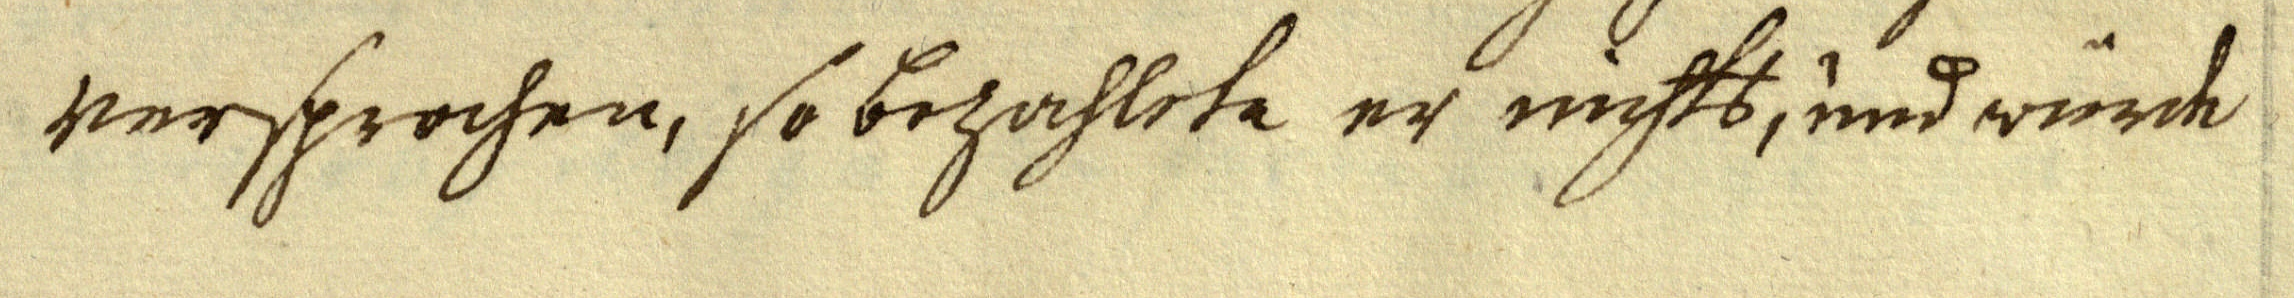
versprochen, so bezahlete er nichts, und würde
